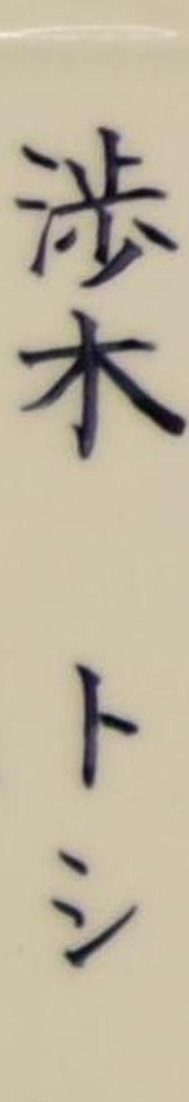渉木トシ
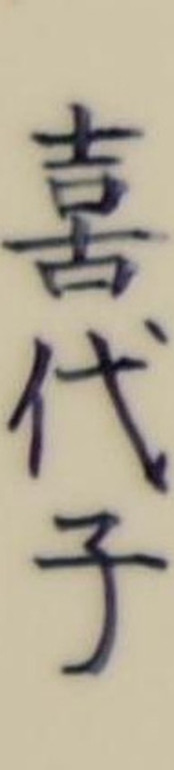喜代子

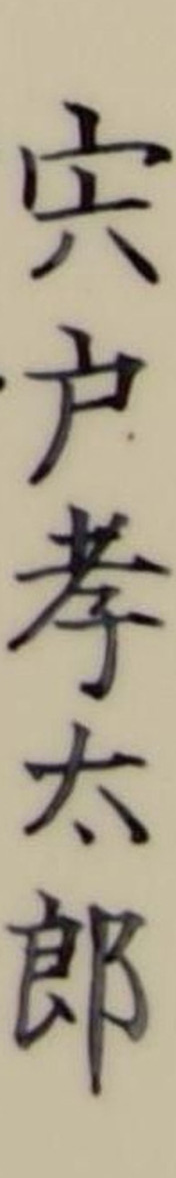宍戸孝太郎
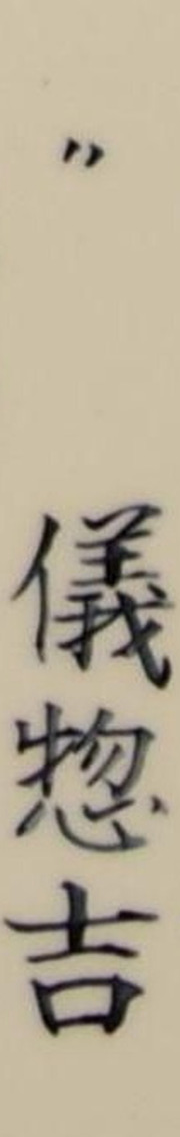儀惣吉
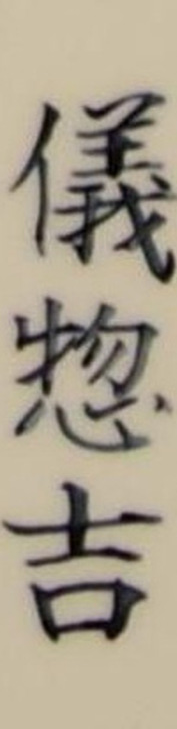儀惣吉
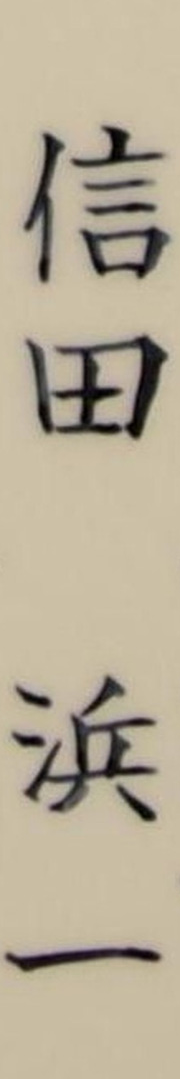信田浜一
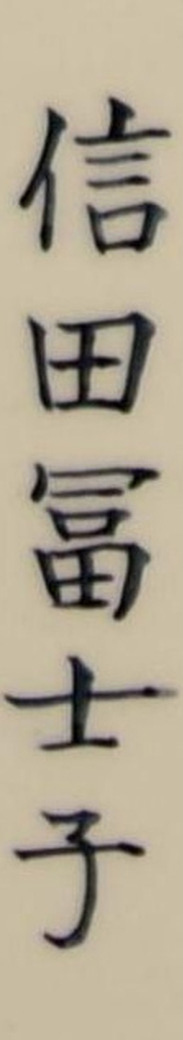信田冨士子
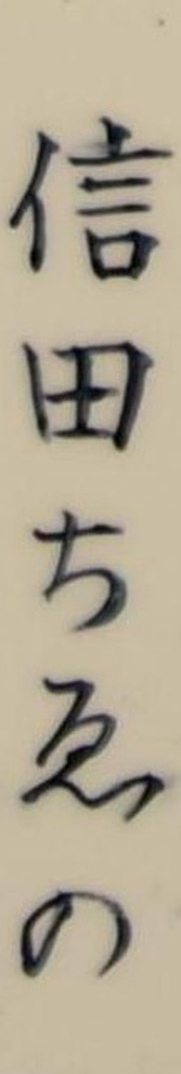信田ちゑの
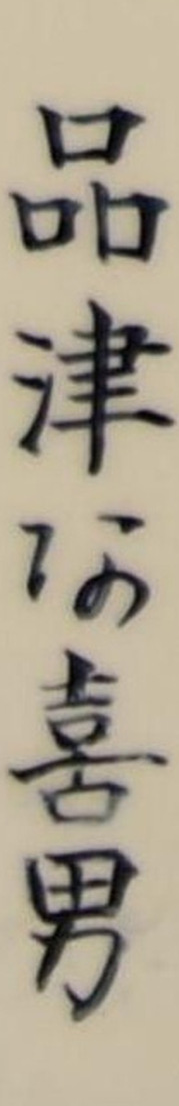品津あ喜男
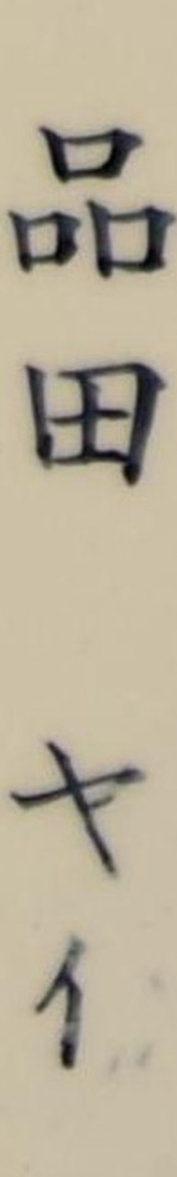品田ヤイ
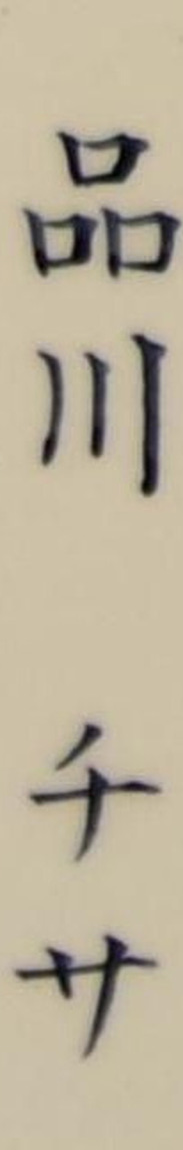品川チサ
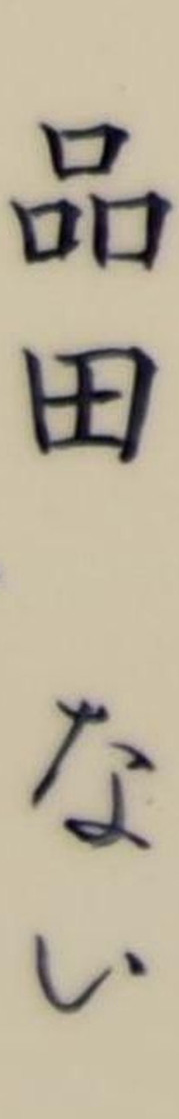品田ない
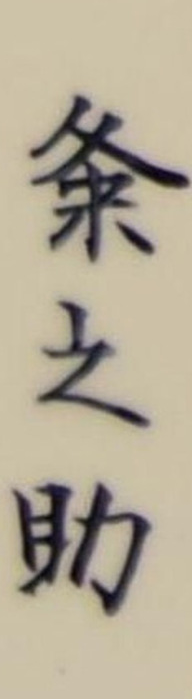粂之助
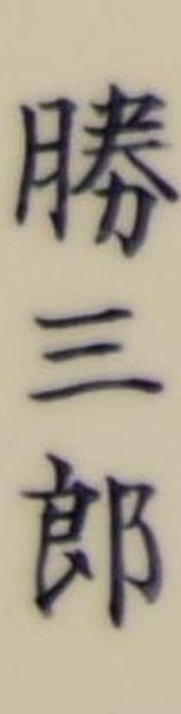勝三郎

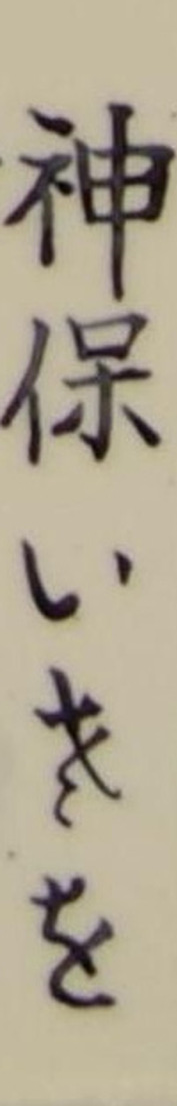神保いさを
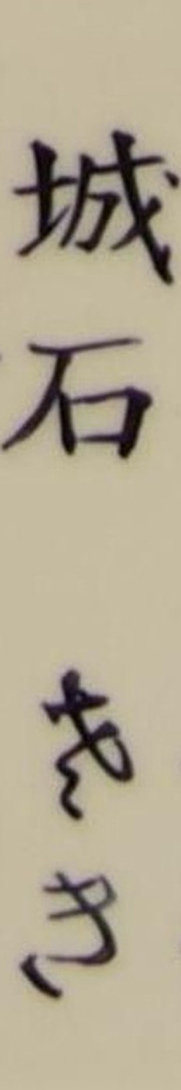城石さき
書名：A~D
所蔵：koyasan kongobuji
